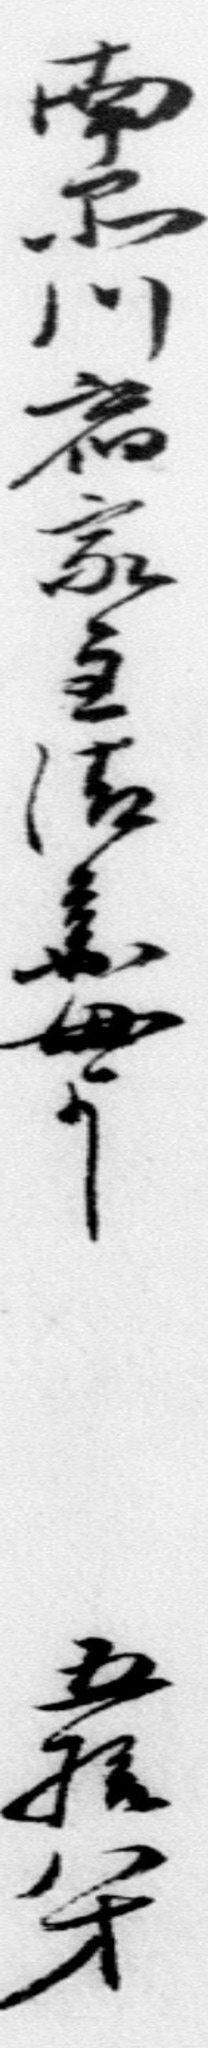南品川宿家主清兵衛母よし五拾八才
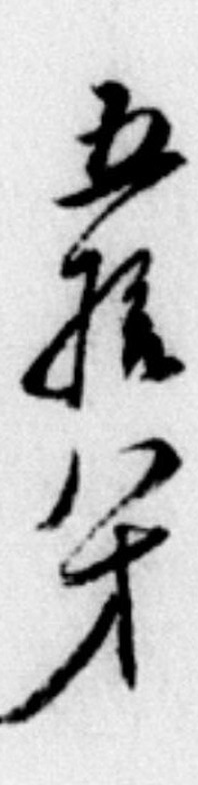六拾八才
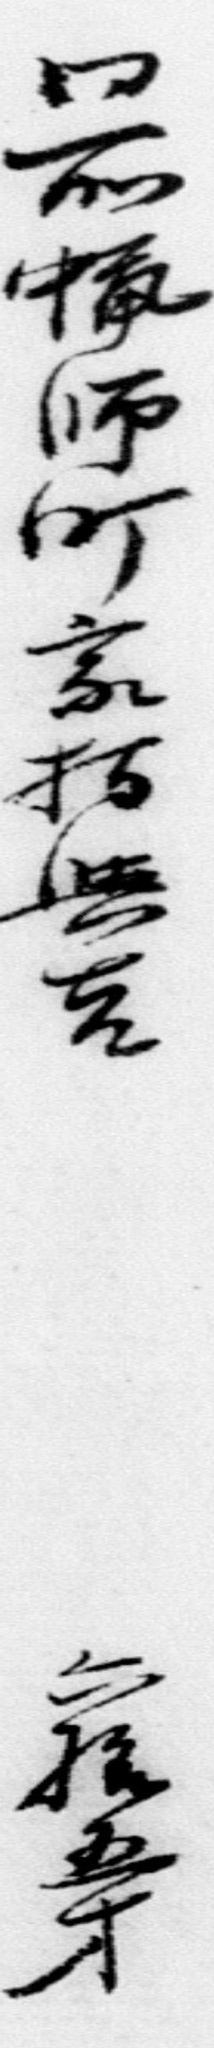同所蝋師町家持与吉六拾五才
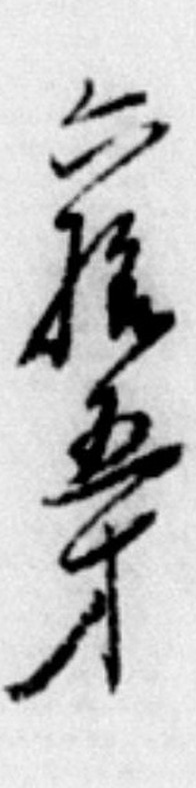六拾八才
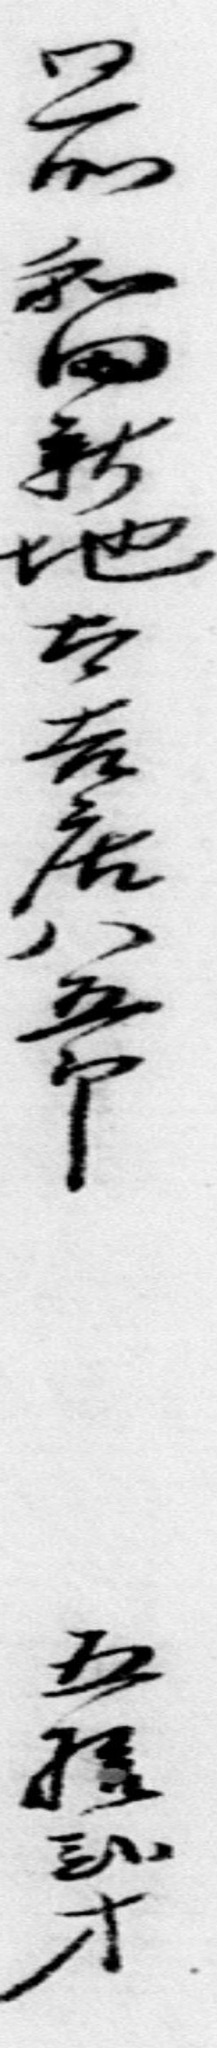同所和田新地太吉店八五郎五拾弐才
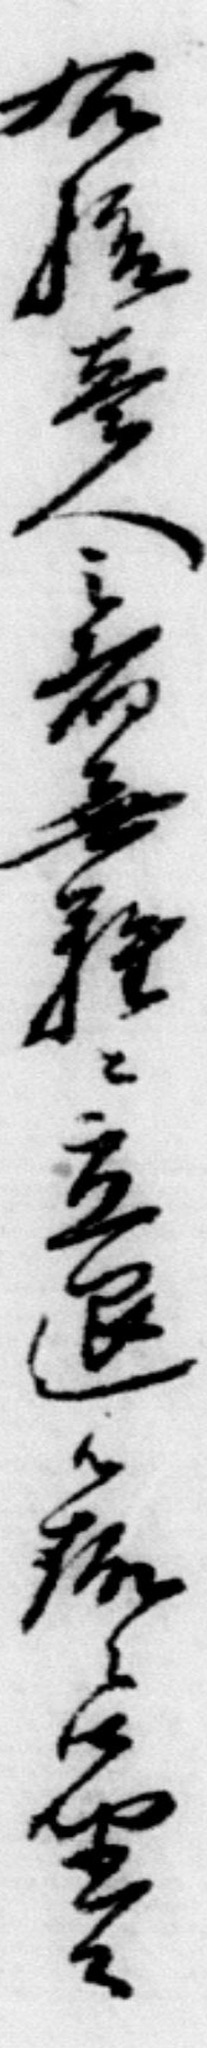右拾壱人之者無難に立退候趣に御座候
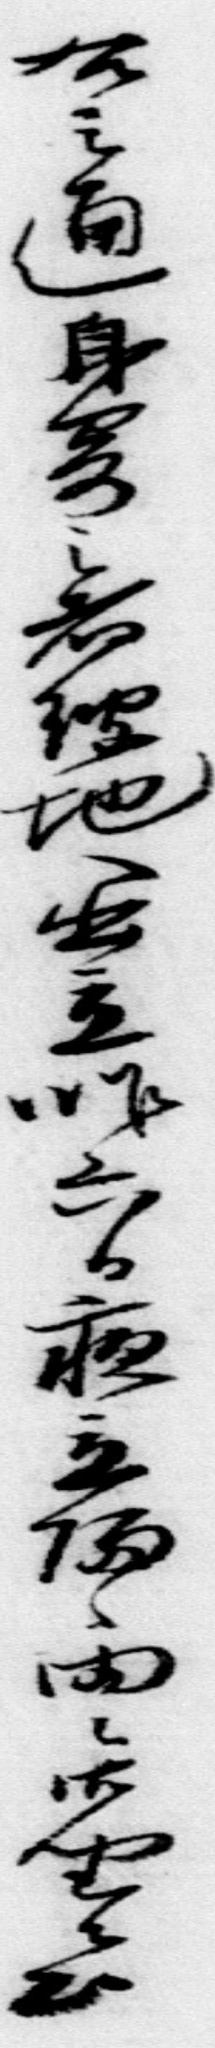右之通身寄之者彼地へ出立昨六日夜立帰候由に御座候以上

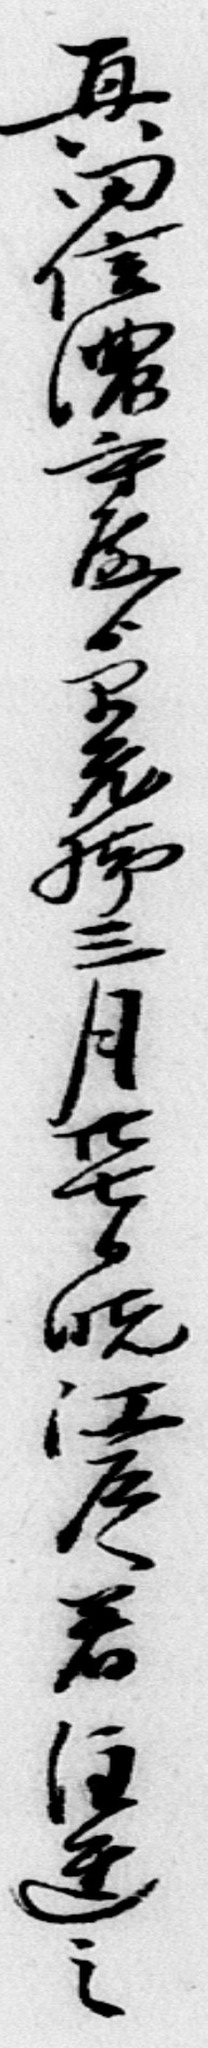真田信濃守殿ゟ早飛脚三月廿七日晩江戸へ着注進之
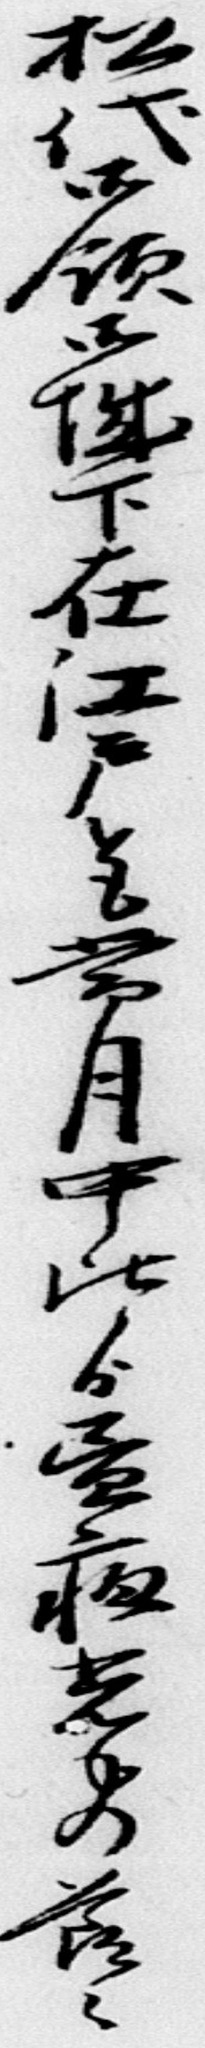松代御領御城下在江戸とも当月中頃ゟ昼夜光もの節々
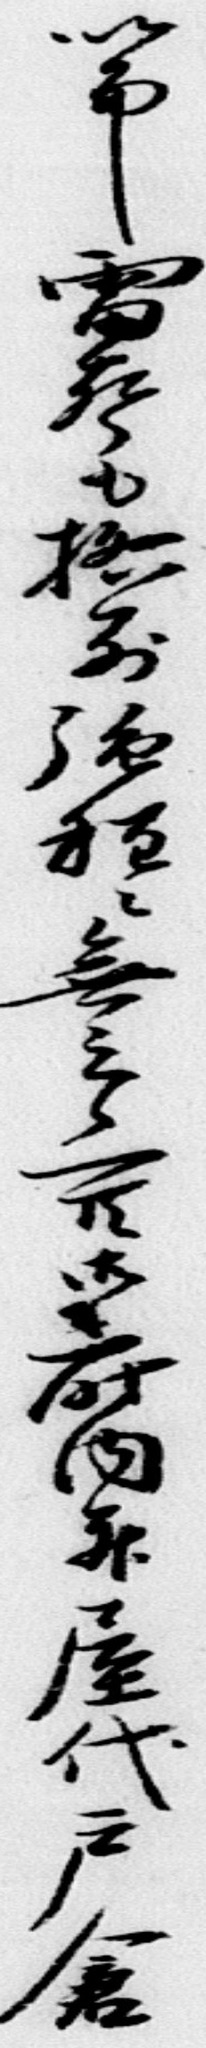いたし雷声も格別強程に無之候へ共御府内幷屋代戸倉
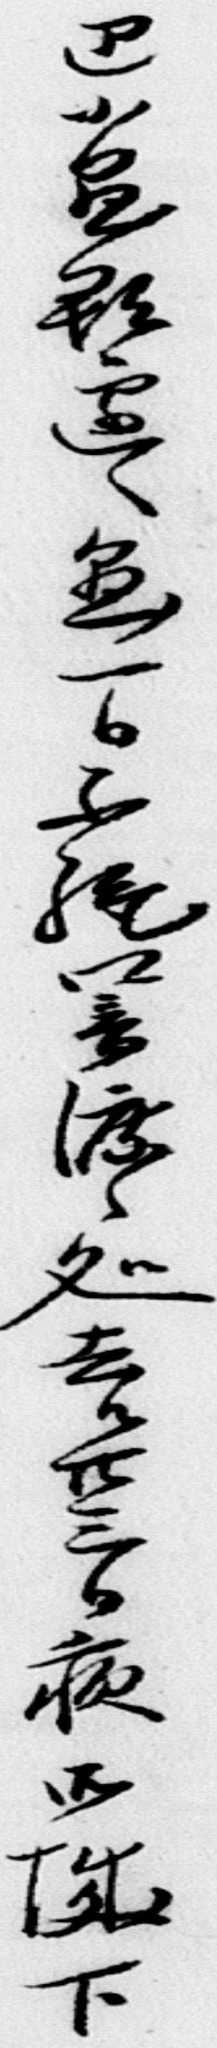辺小県郡辺へ懸一日不絶響渡候処去る廿三日夜御城下
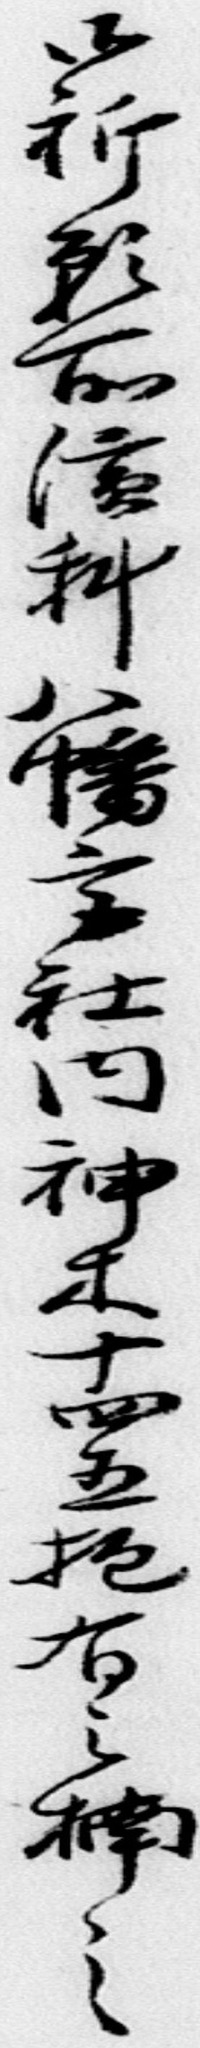御祈願所浜科八幡宮社内神木十四五抱有之楠之
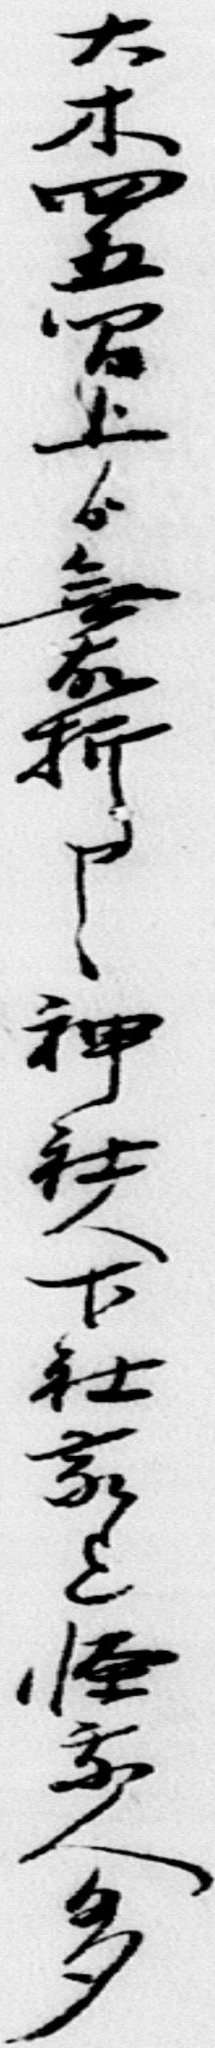大木四五間上ゟ無故折申候神社人下社家迄怪我人多
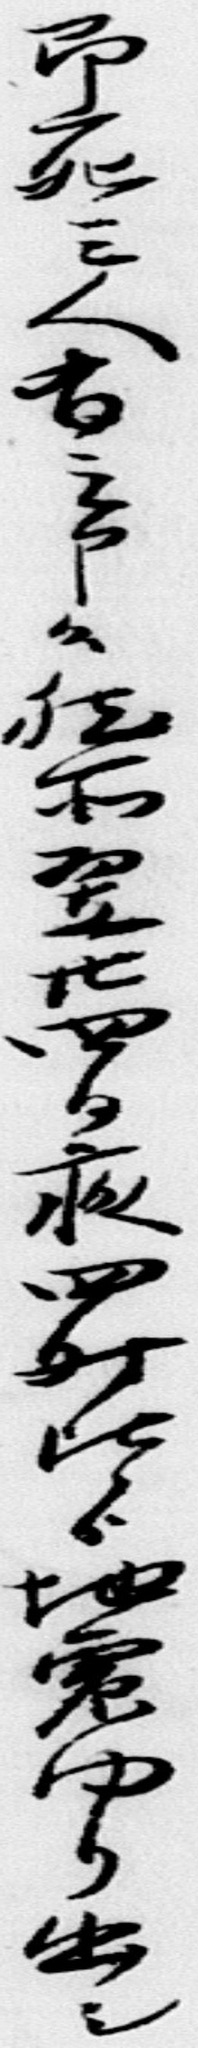即死三人有之申候然所翌廿四日夜四時頃ゟ地震ゆり出し
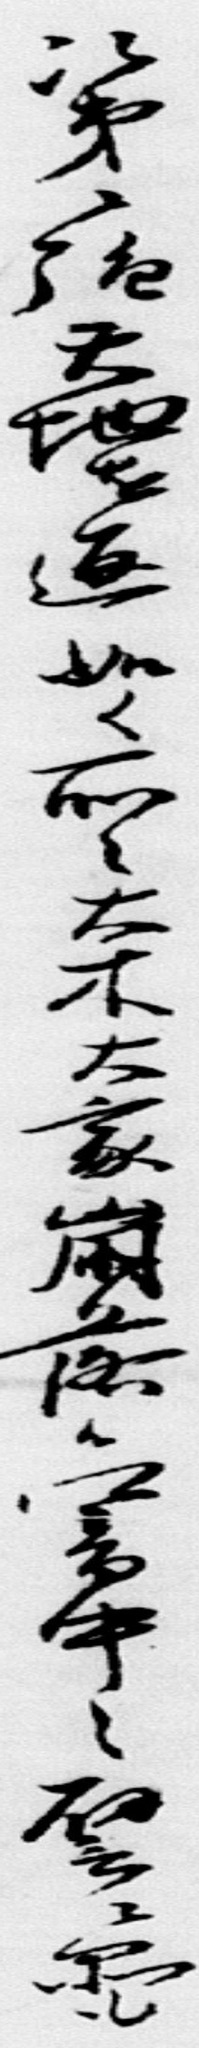次第に強天地を返如く所々大木大家崩落候響中々譬に品も
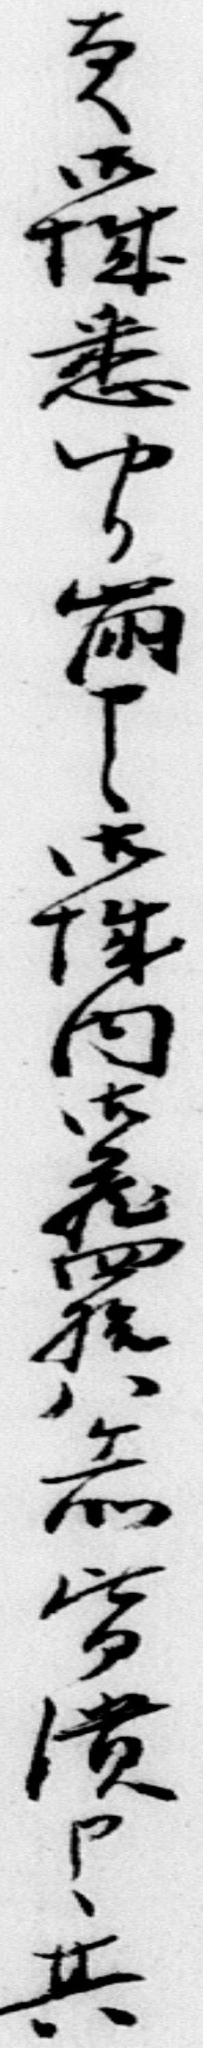なく御城悉ゆり崩申候御城内御蔵四拾八ケ所皆潰申候其
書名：信州大地震一件
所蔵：徳島県立図書館
